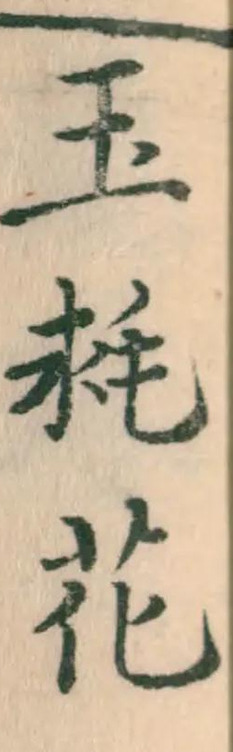玉毬花

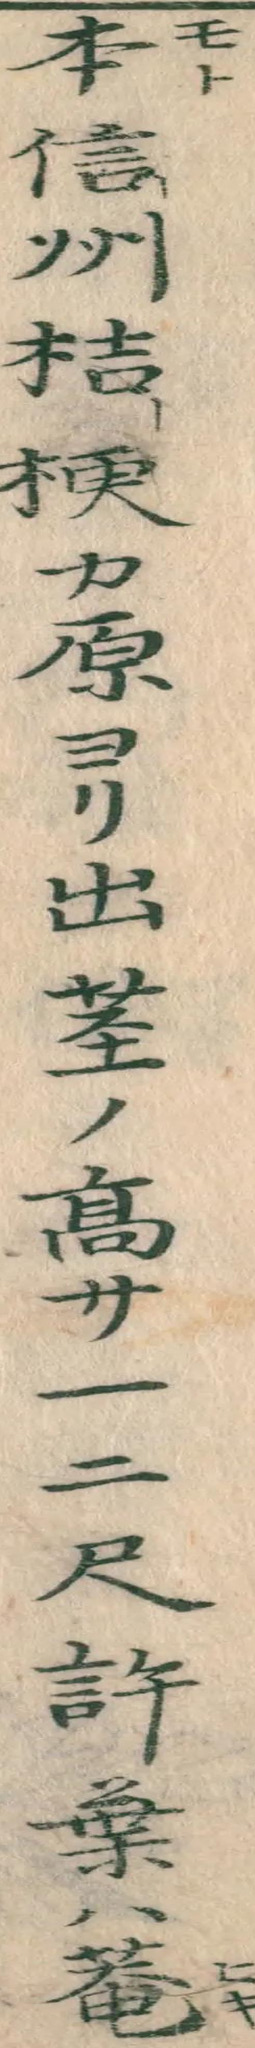本信-州桔-梗カ原ヨリ出茎ノ高サ一二尺許葉ハ菴
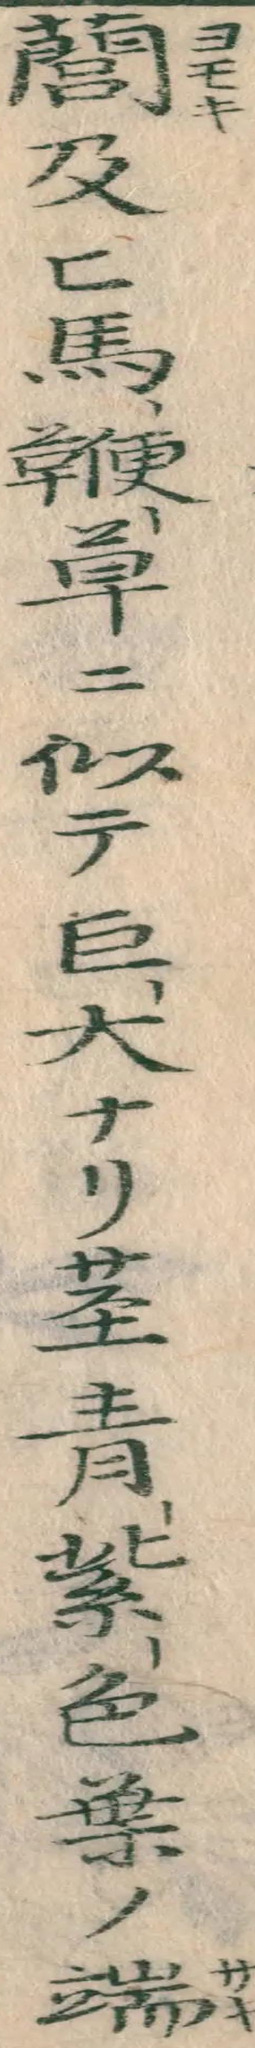䕡及ヒ馬-鞭-草ニ似テ巨-大ナリ茎青-紫-色葉ノ端
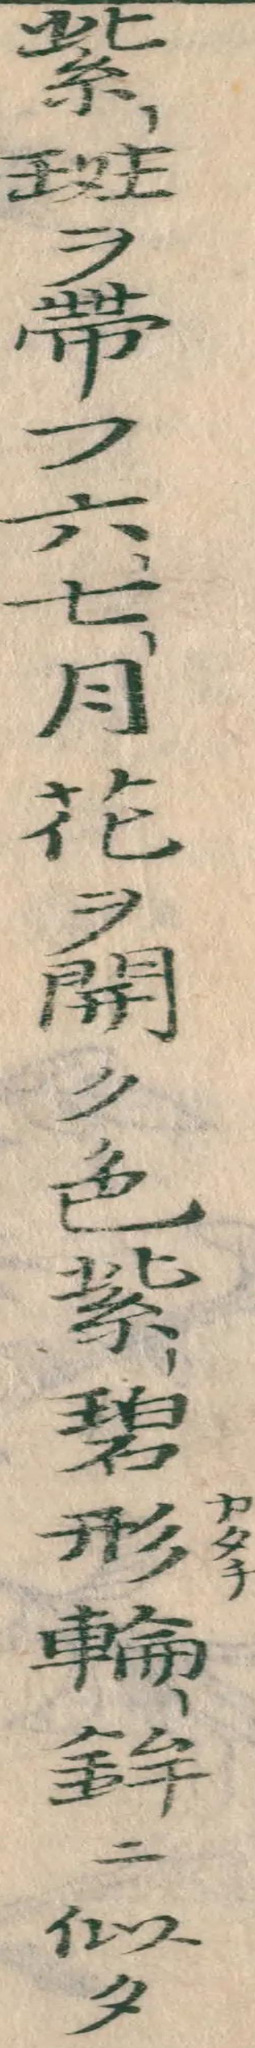紫-斑ヲ帯フ六-七-月花ヲ開ク色紫-碧形輪-ニ似タ
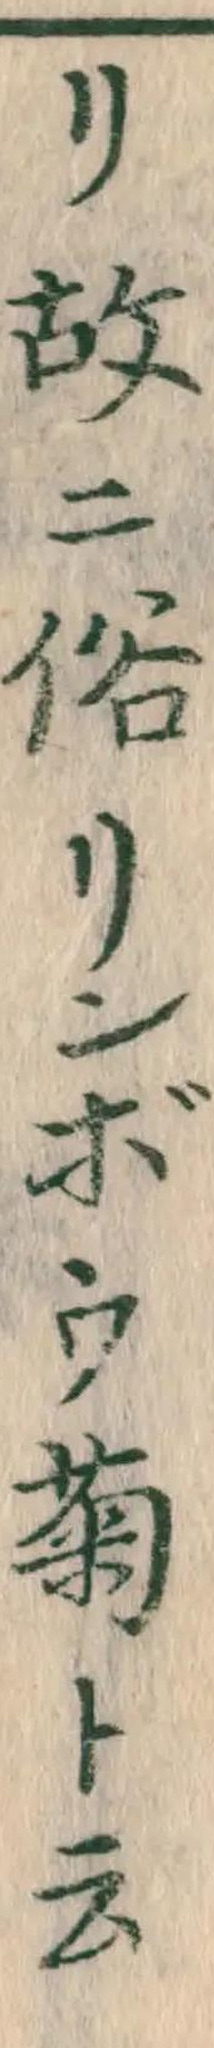リ故ニ俗リンボウ菊ト云

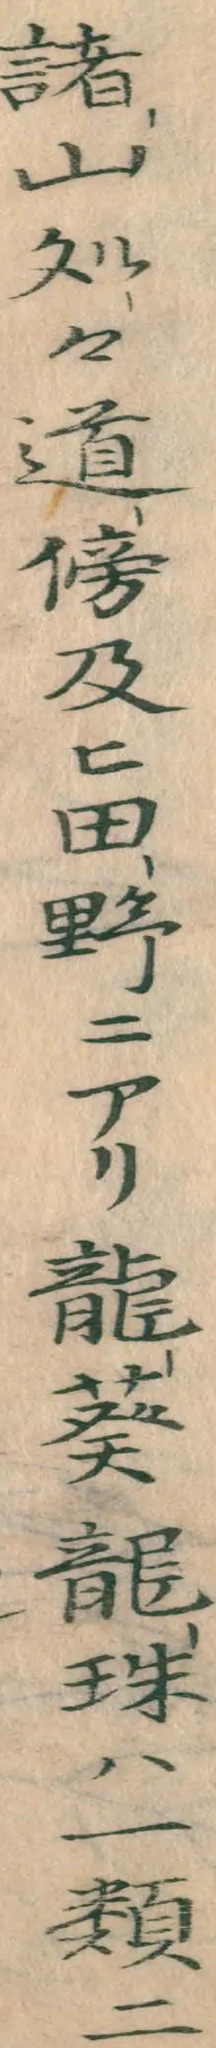諸-山処-々道-傍及ヒ田-野ニアリ竜-葵竜-珠ハ一類二
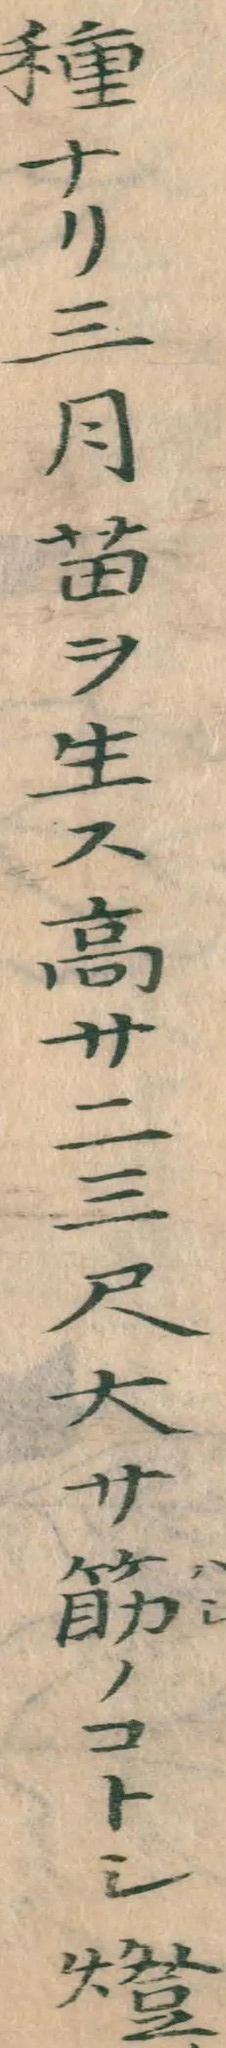種ナリ三月苗ヲ生ス高サ二三尺大サ筯ノコトシ灯-
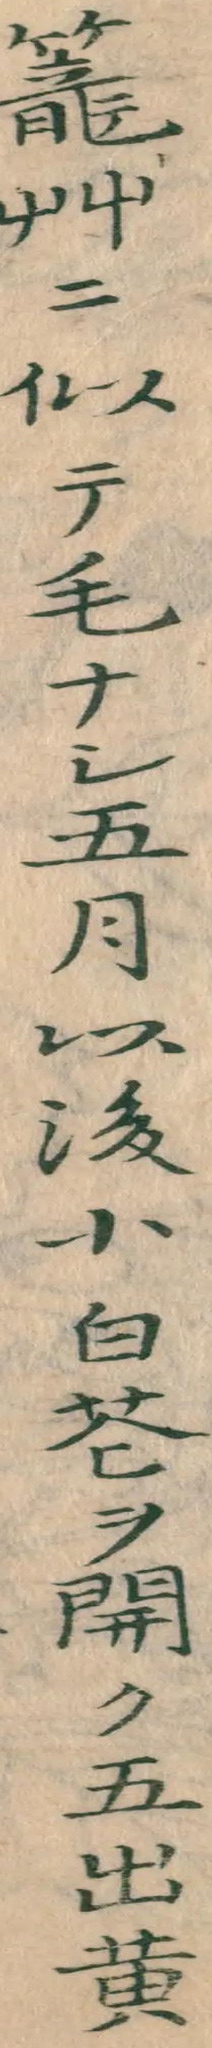籠-艸ニ似テ毛ナシ五月以後小白花ヲ開ク五出黄
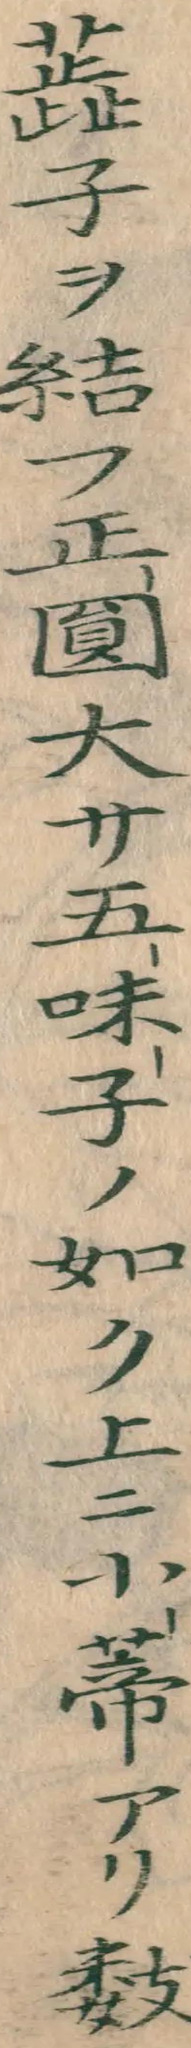蕊子ヲ結フ正-円大サ五-味-子ノ如ク上ニ小-蒂アリ数-
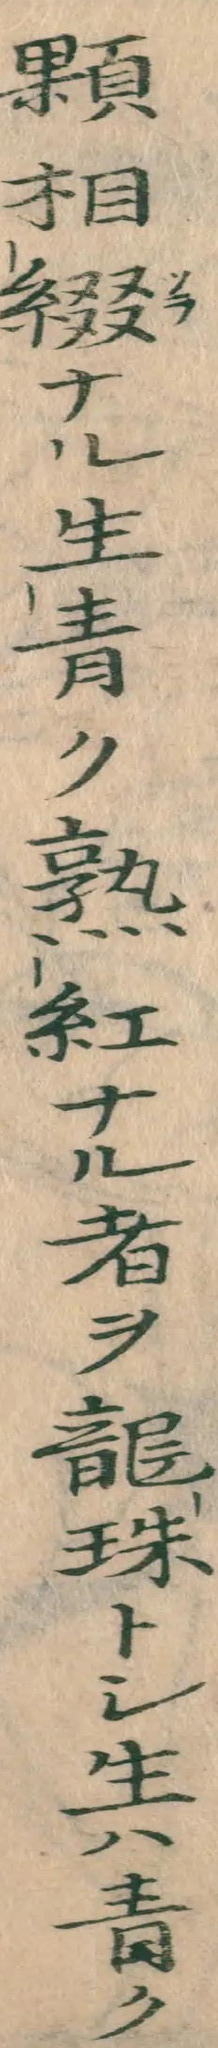顆相-綴ナル生-青ク熟-紅ナル者ヲ竜-珠トシ生ハ青ク
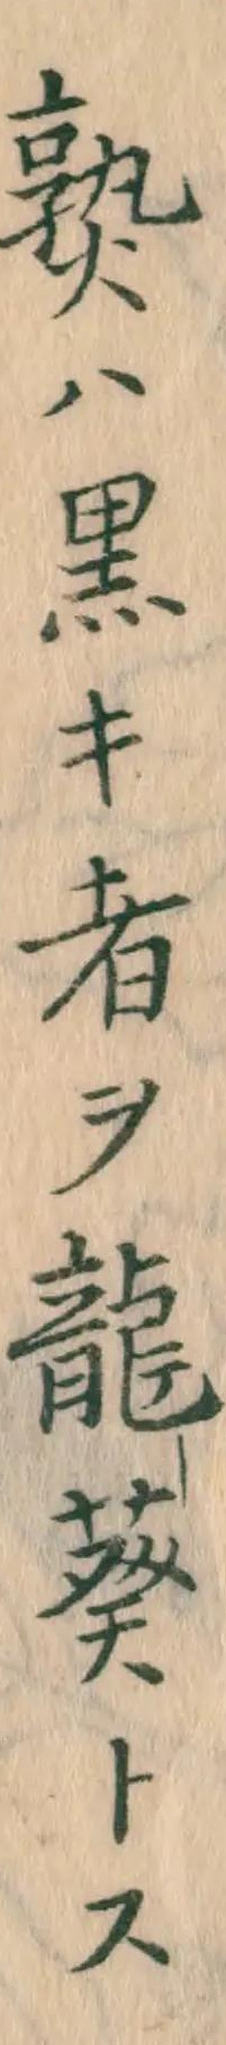熟ハ黒キ者ヲ竜-葵トス
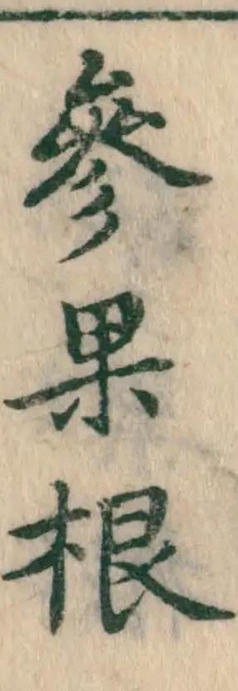参果根

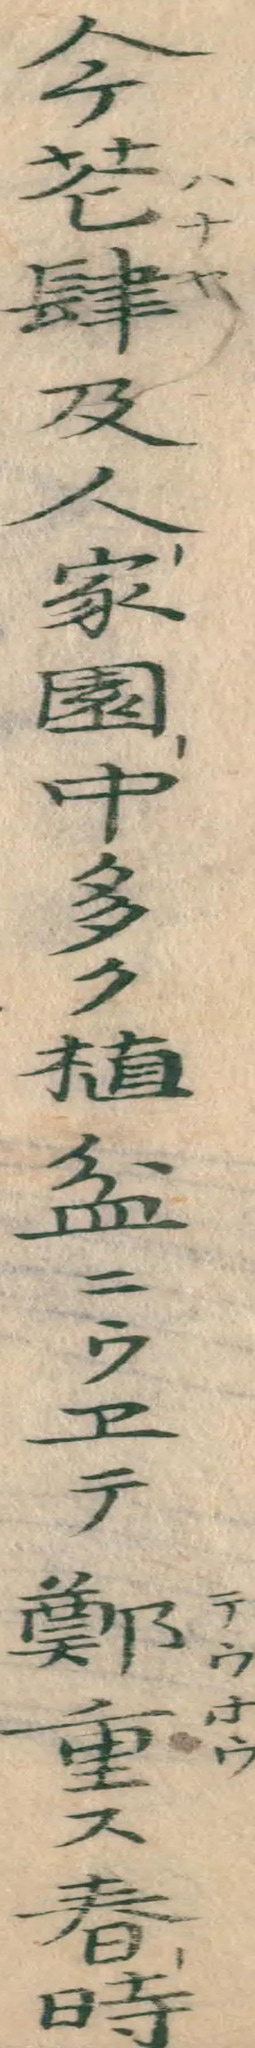今花肆及人-家園-中多ク植盆ニウヱテ鄭重ス春-時
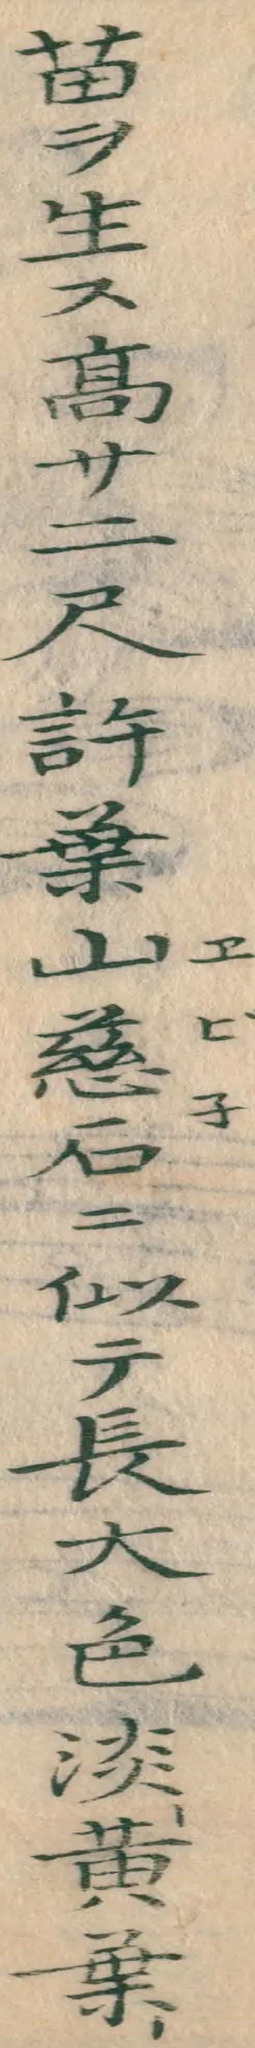苗ヲ生ス高サ二尺許葉山慈石ニ似テ長大色淡-黄葉-
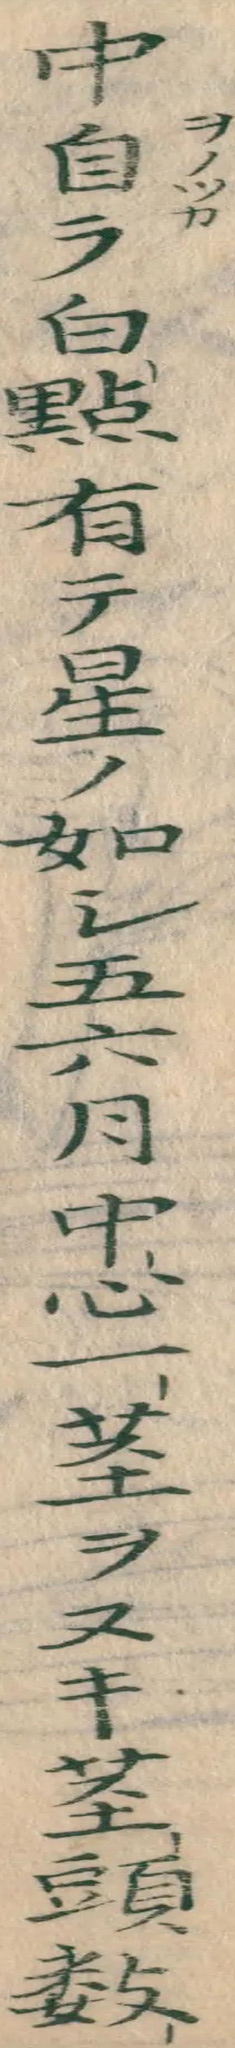中自ラ白-点有テ星ノ如シ五六月中-心一-茎ヲヌキ茎-頭数-
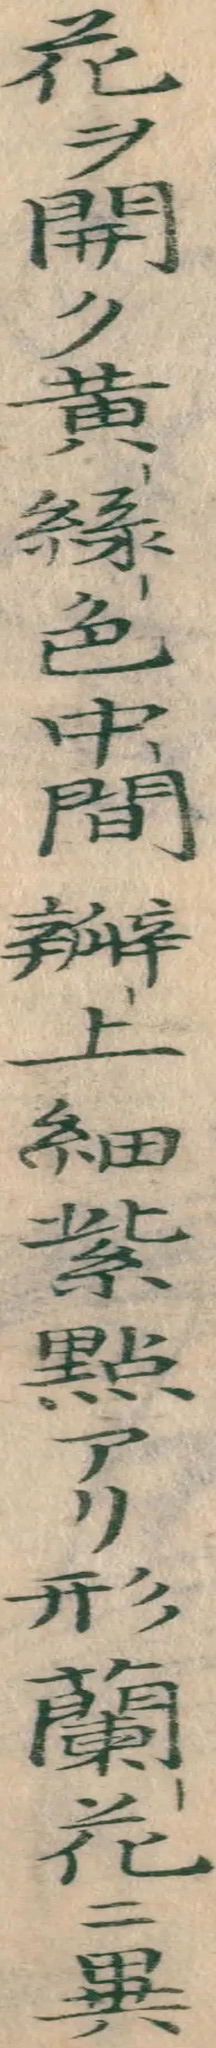花ヲ開ク黄-緑-色中-間弁-上細紫点アリ形蘭-花ニ異
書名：花彙 草部4巻木部4巻. [1]
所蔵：国立国会図書館 National Diet Library, JAPAN
